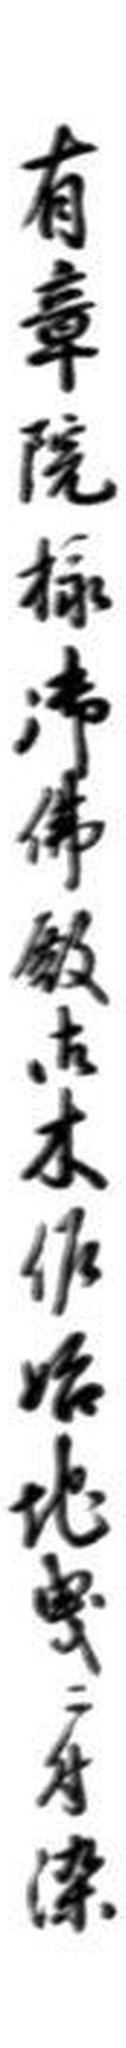有章院様御仏殿御木作始地曳ニ付染
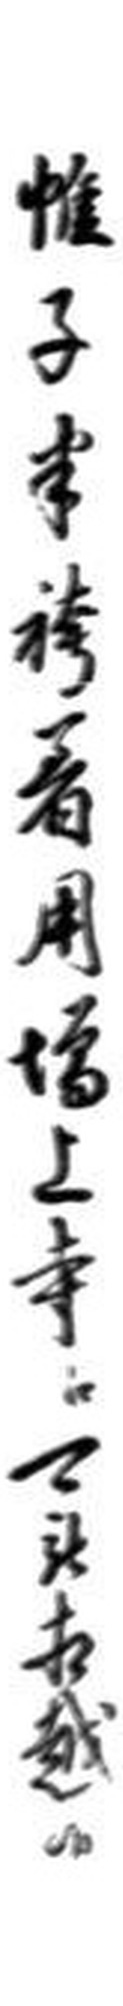帷子半袴着用増上寺江可被相越候
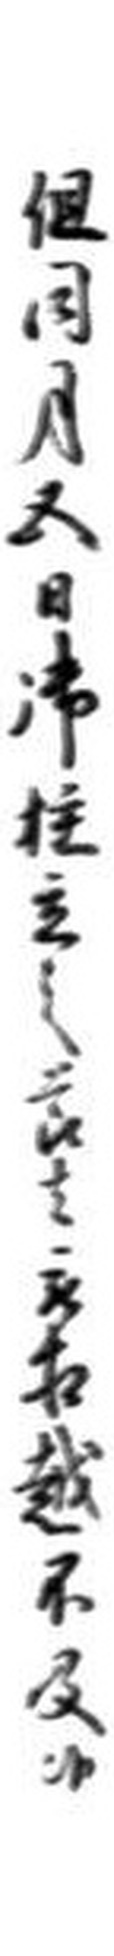但同月五日御柱立之節者被相越不及候
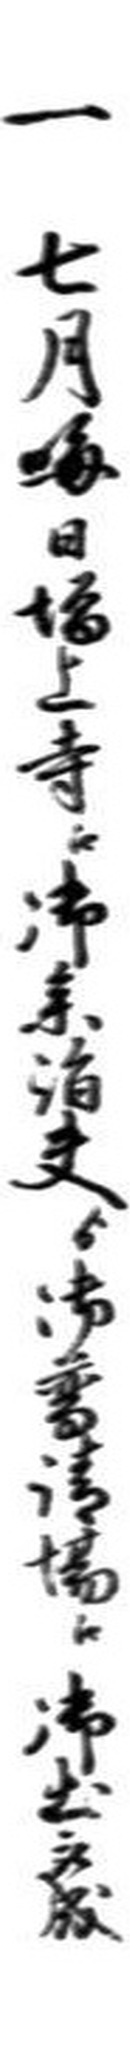一七月晦日増上寺江御参詣夫ゟ御普請場江御出被成
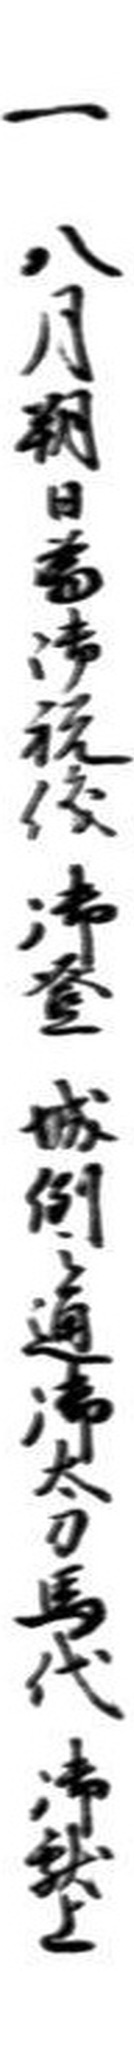一八月朔日為御祝儀御登城例之通御太刀馬代御献上
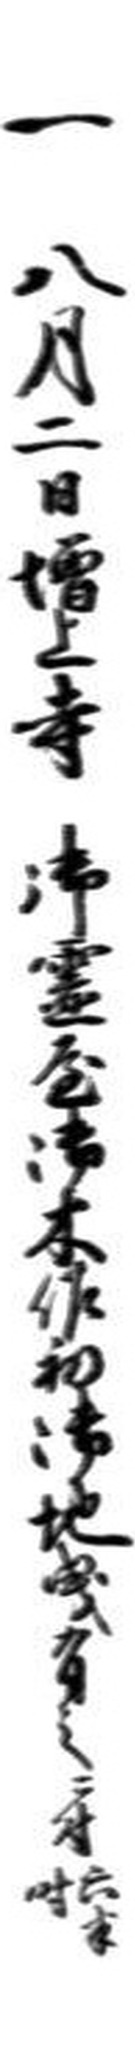一八月二日増上寺御霊屋御木作初御地曳有之ニ付六半時
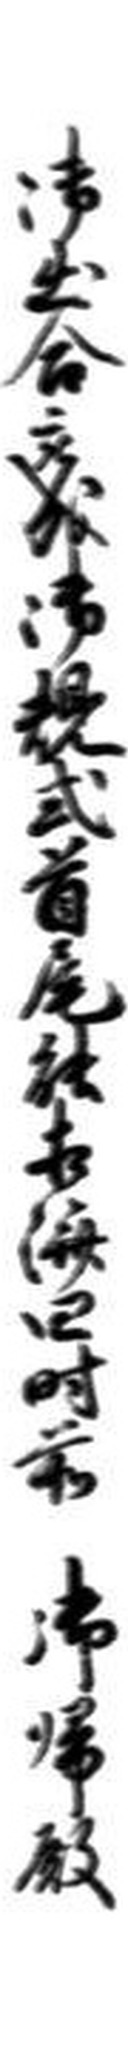御出合被成御規式首尾能相済四時前御帰殿

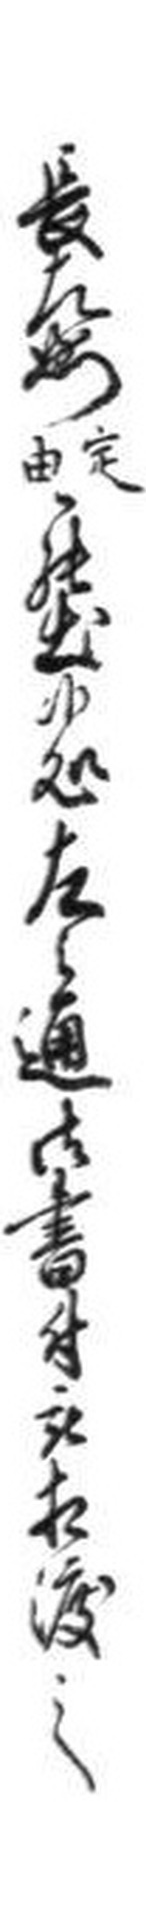長左衛門定由罷出候処左之通御書付被相渡之
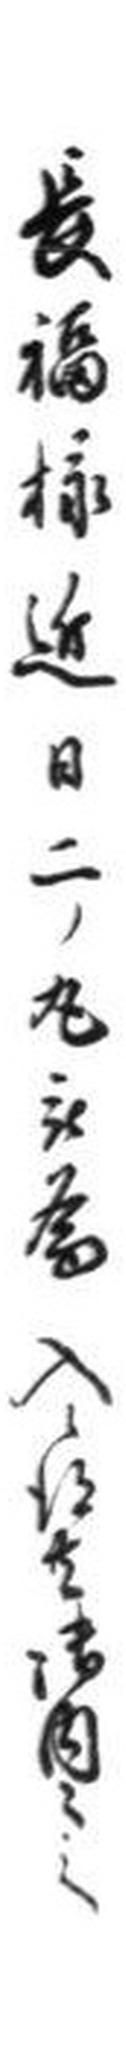長福様近日二ノ丸為入候得共御内々之
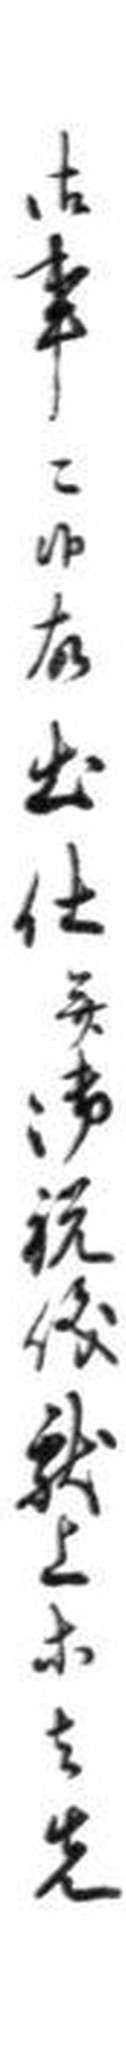御事ニ候故出仕并御祝儀献上等者先
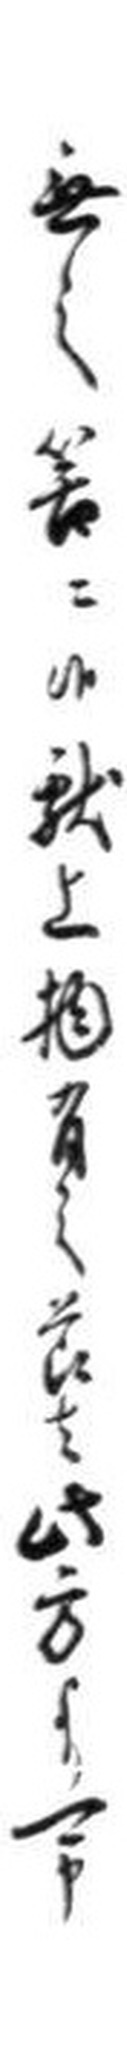無之筈ニ候献上物有之節者此方より可申
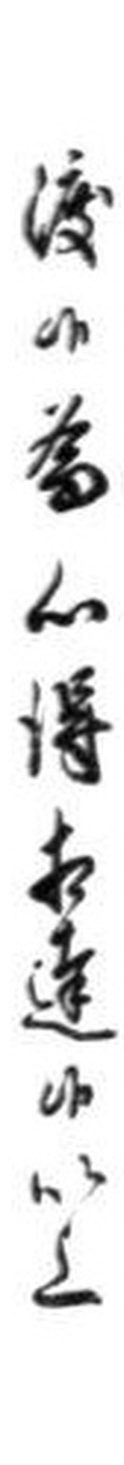渡候為心得相達候以上
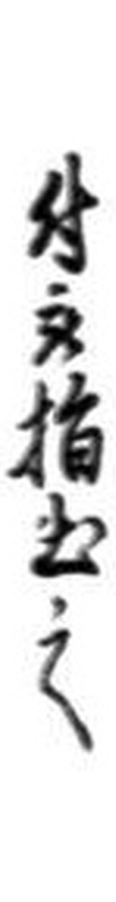付被指出之
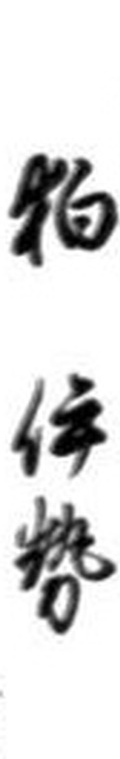狛伊勢
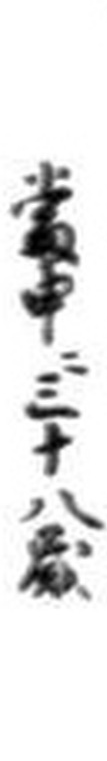当申ニ三十八歳
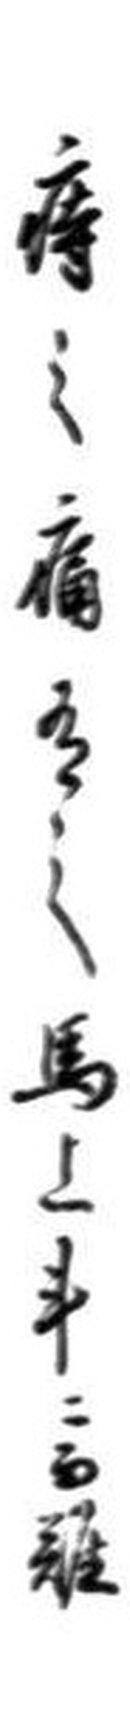痔之痛有之馬上計ニ而難
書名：家譜 三十一 吉邦公 享保元年
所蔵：福井県文書館 Fukui Prefectural Archives
